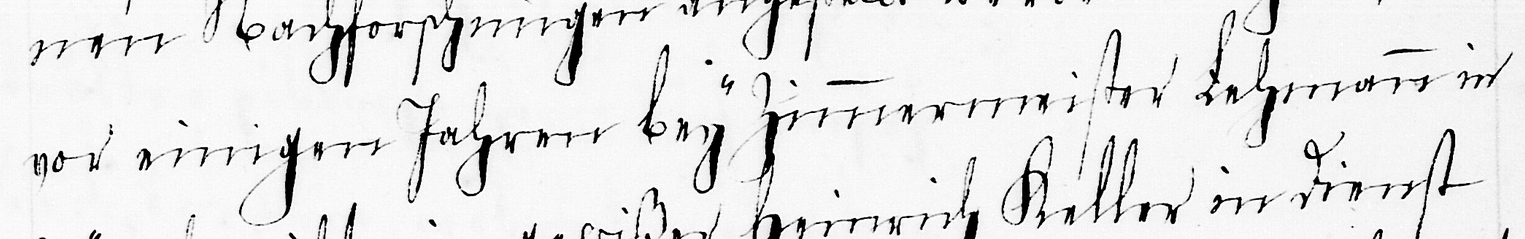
vor einigen Jahren bey Zimmermeister Lehmann in
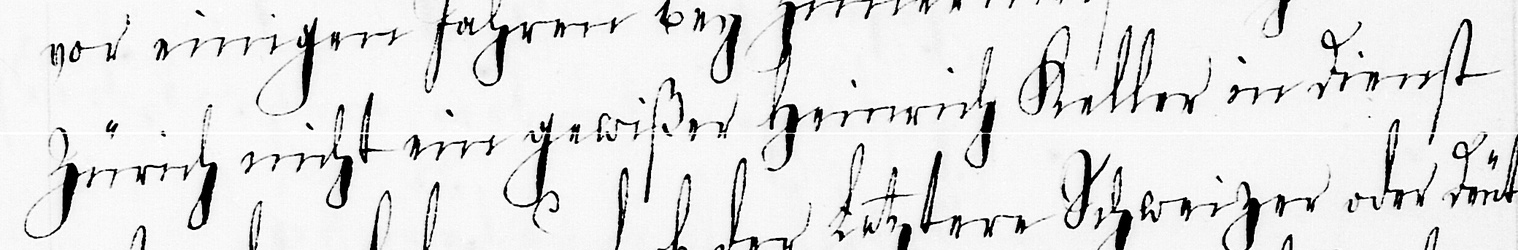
Zürich nicht ein gewißer Heinrich Keller im Dienst
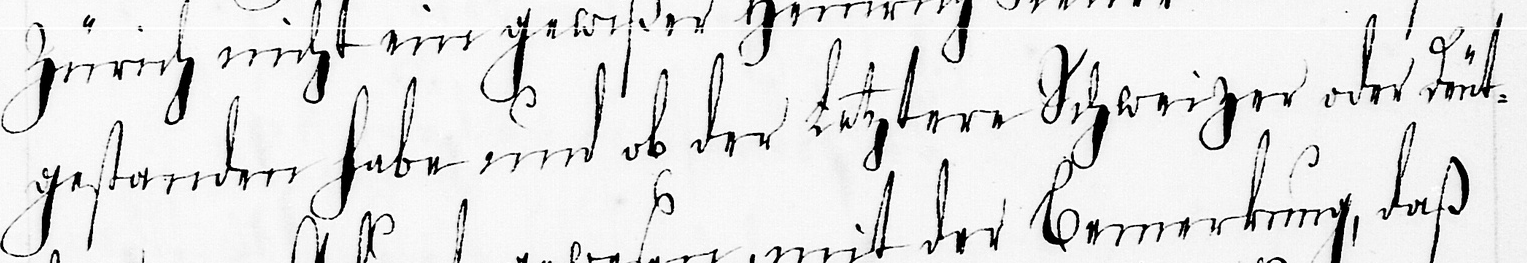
gestanden habe und ob der Letztere Schweizer oder Deu¬
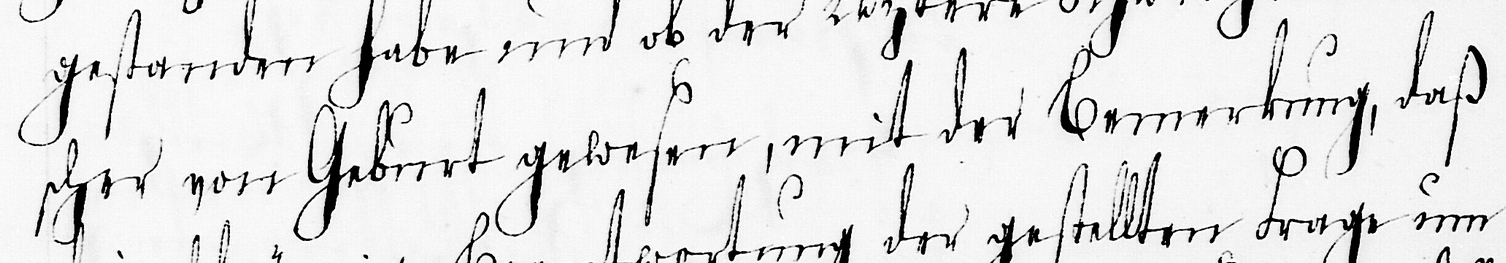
scher von Geburt gewesen, mit der Bemerkung, daß
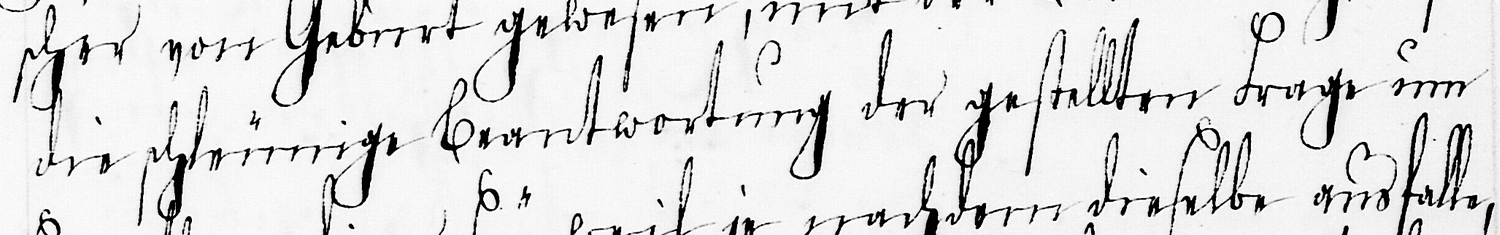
die schleunige Beantwortung der gestellten Frage um
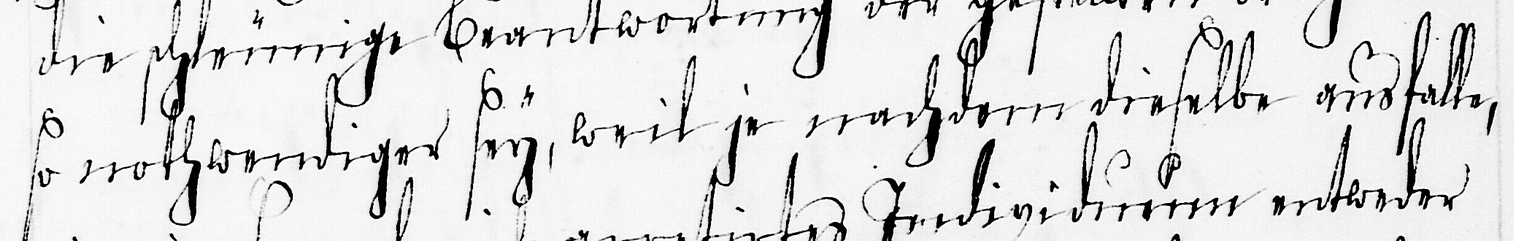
so nothwendiger sey, weil je nachdem dieselbe ausfal¬
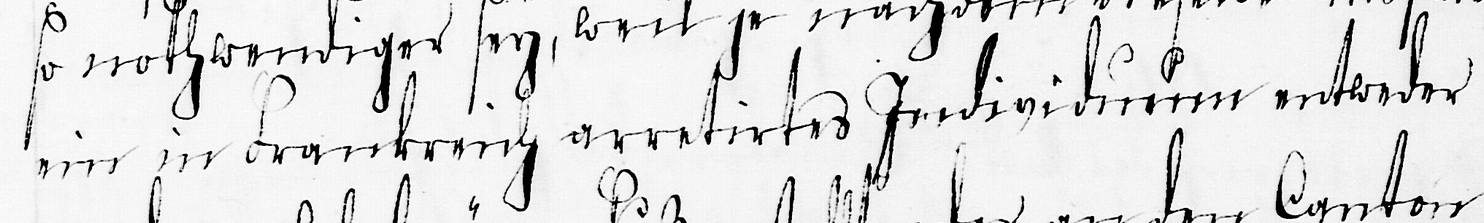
ein in Frankreich arretirtes Individuum entweder
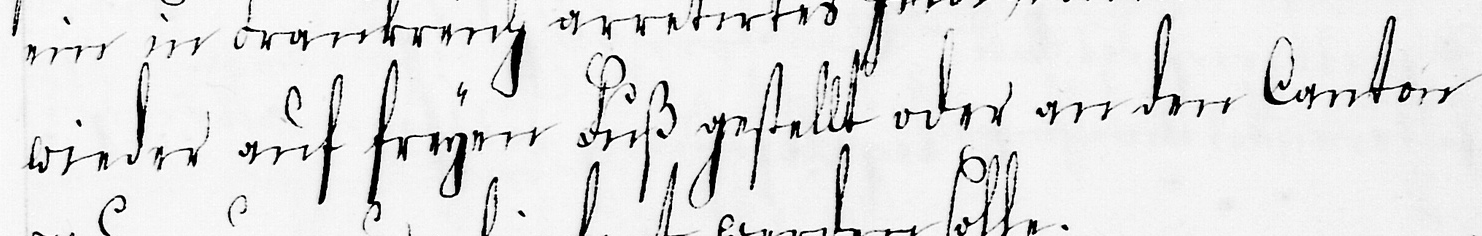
wieder auf freyen Fuß gestellt oder an den Canton
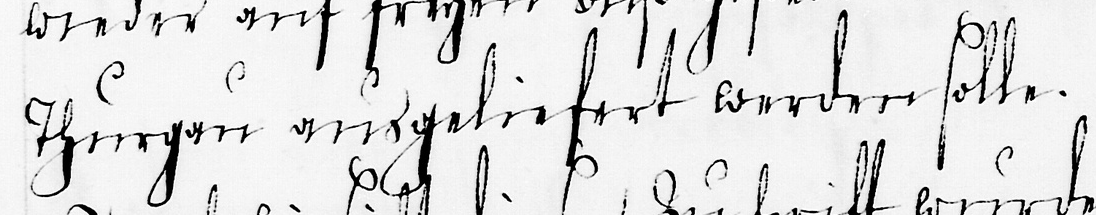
Thurgau ausgeliefert werden solle.
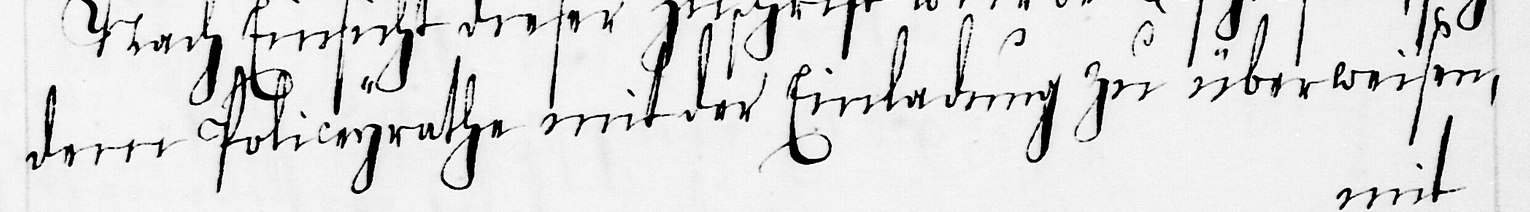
dem Policeyrathe mit der Einladung zu überweisen,
